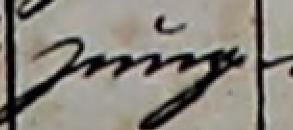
zung
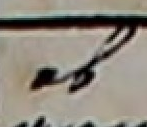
ob
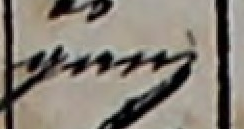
ganz
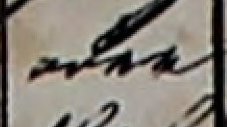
wer
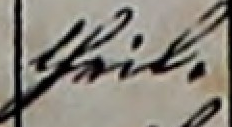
theil.
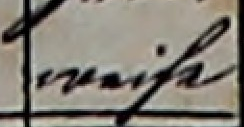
weise
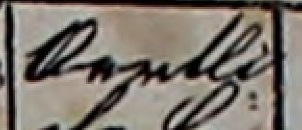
Oertli„
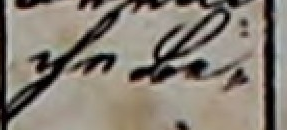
che Be
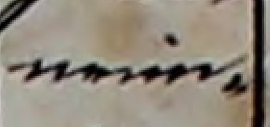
n???„
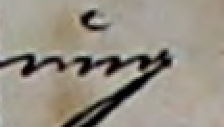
ung
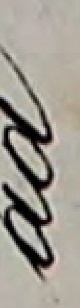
ad
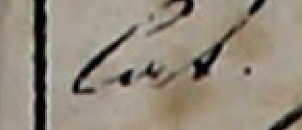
Cat.
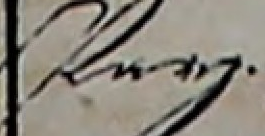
Perg.
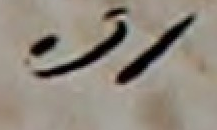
51
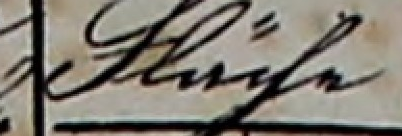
Fläche
